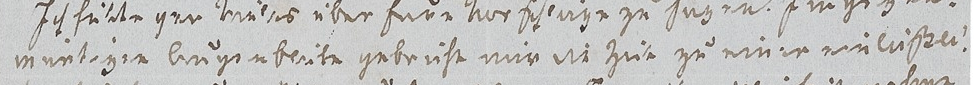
wärtigen Augenblicke gebricht mir die Zeit zu einer einläßli-
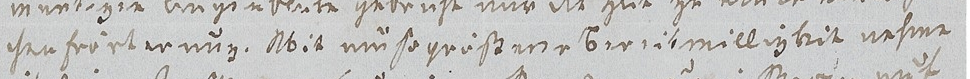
chen Erörterung. Mit um so größerer Bereitwilligkeit nehme
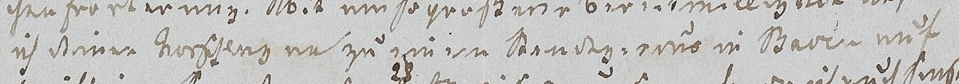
ich deinen Vorschlag an zu einem Rendez-vous in Baden auf
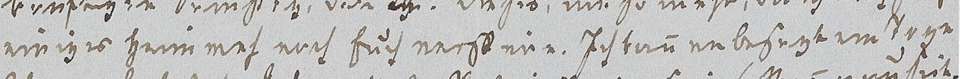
einiges Heimweh nach Euch verspüre. Ich kann an besagtem Tage
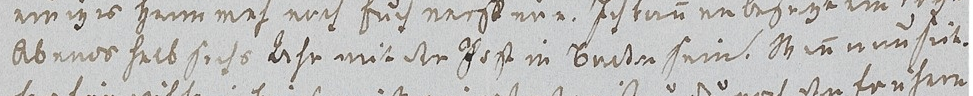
Abends halb sechs Uhr mit der Post in Baden sein. Wenn nun seit-
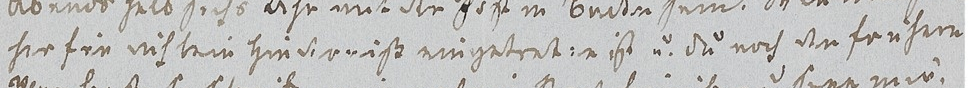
her für dich kein Hinderniß eingetreten ist u. du noch den frühern
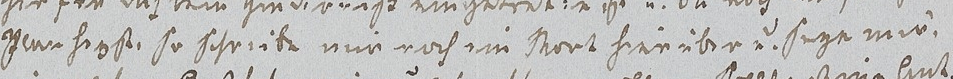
Plan hegst, so schreibe mir noch ein Wort hierüber u. sage mir,
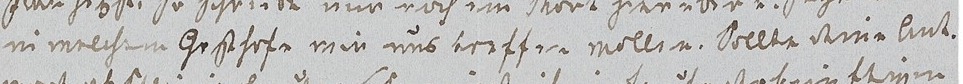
in welchem Gasthofe wir uns treffen wollen. Sollte deine Ant-
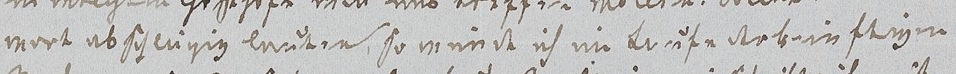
wort abschlägig lauten, so würde ich im Laufe der künftigen
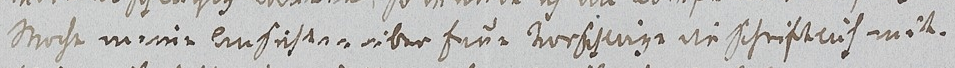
Woche meine Ansichten über Eure Vorschläge dir schriftlich mit-
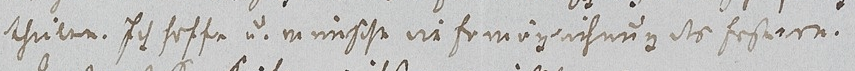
theilen. Ich hoffe u. wünsche die Ermöglichung des Erstern.
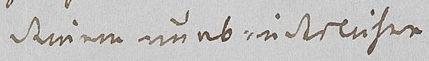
deinem unabänderlichen
